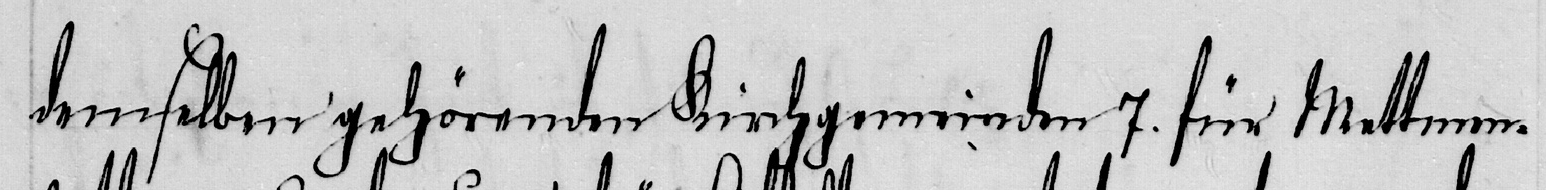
demselben gehörenden Kirchgemeinden 7. für Mettmen¬
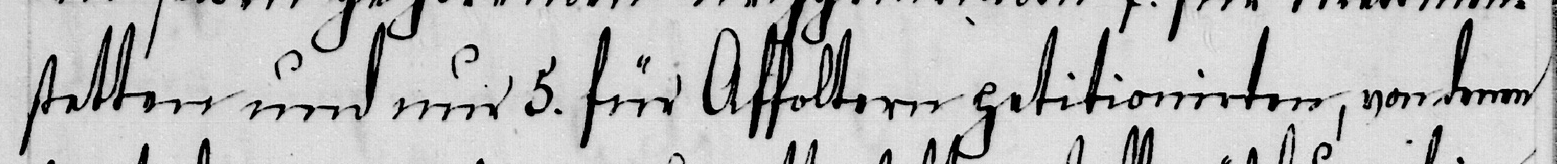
stetten und nur 5. für Affoltern petitionirten, von denen
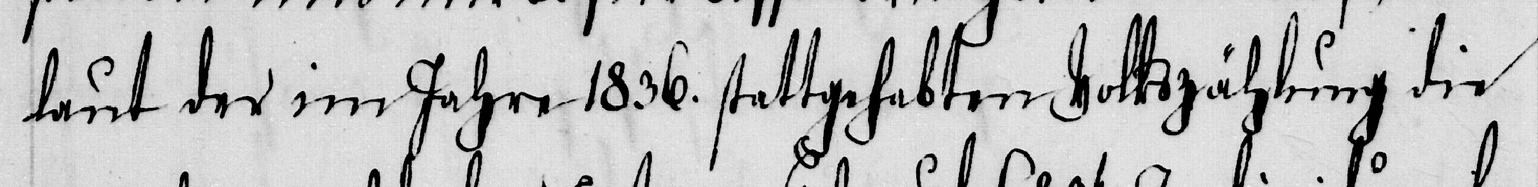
laut der im Jahre 1836. stattgehabten Volkszählung die
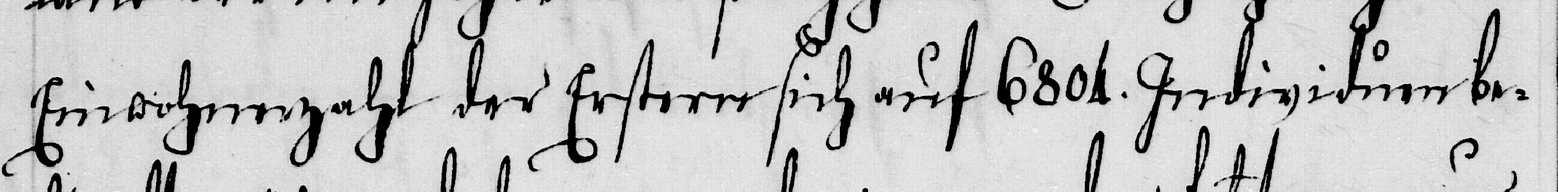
Einwohnerzahl der Erstern sich auf 6804. Individuen be¬
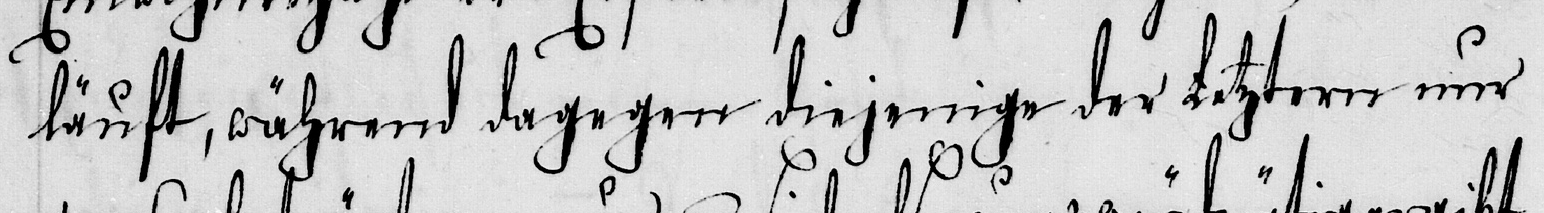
läuft, während dagegen diejenige der Letztern nur
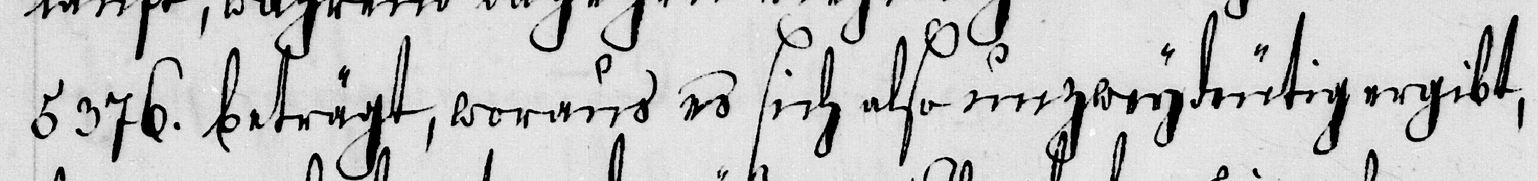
5376. beträgt, woraus sich also unzweydeutig ergibt,
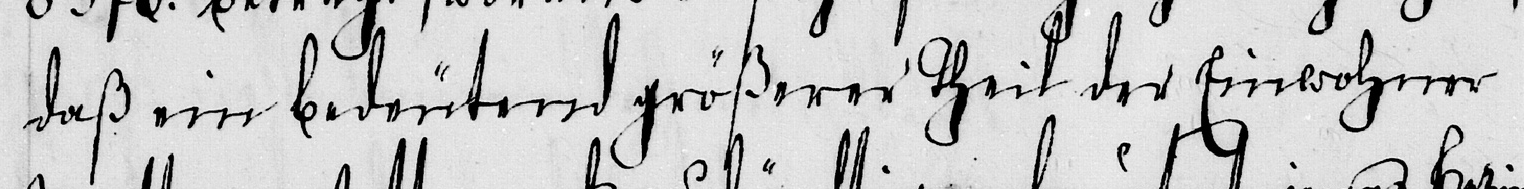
daß ein bedeutend größerer Theil der Einwohner
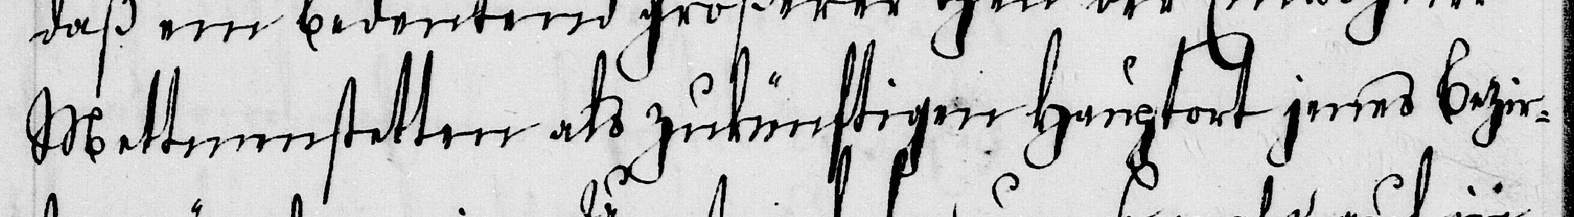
Mettmenstetten als zukünftigen Hauptort jenes Bezi¬
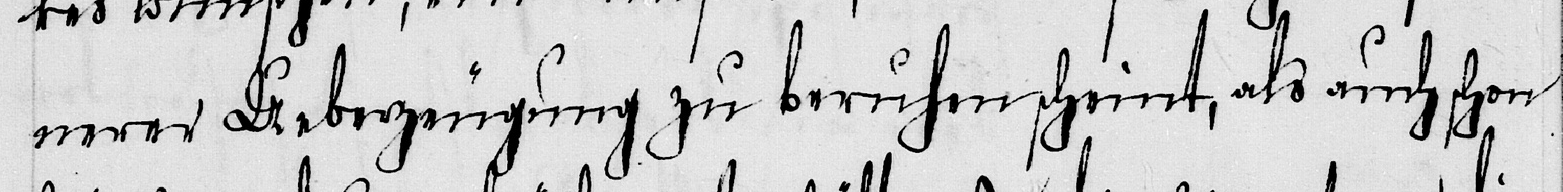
nerer Ueberzeugung zu beruhen scheint, als auch schon
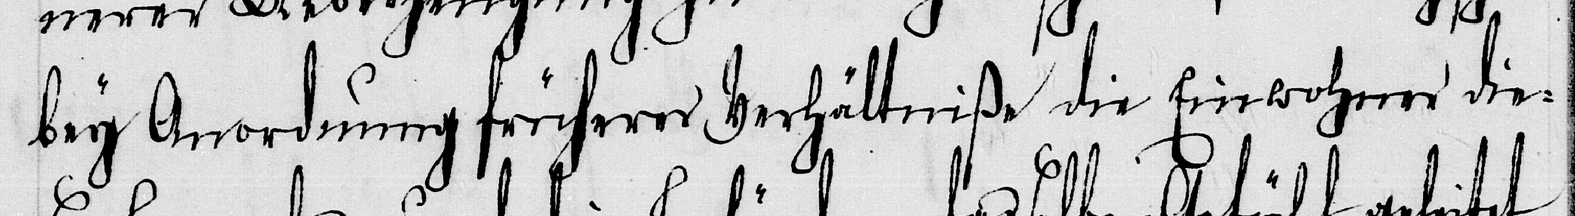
bey Anordnung früherer Verhältniße die Einwohner die¬
